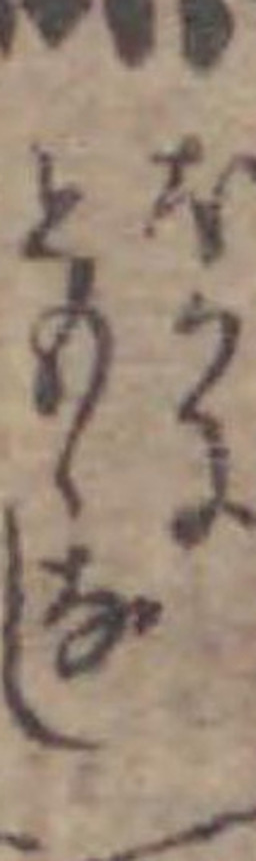ともゝなし
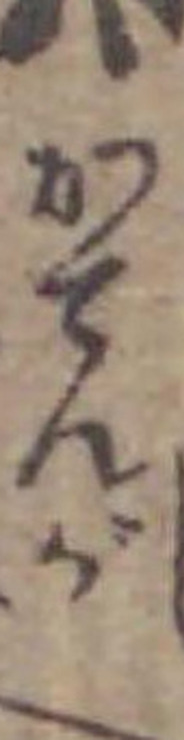がてんが
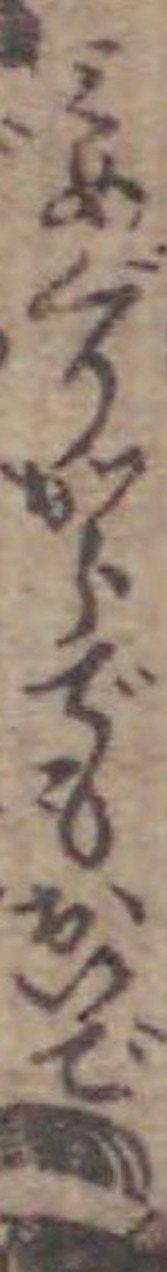みめぐりからでもおいで
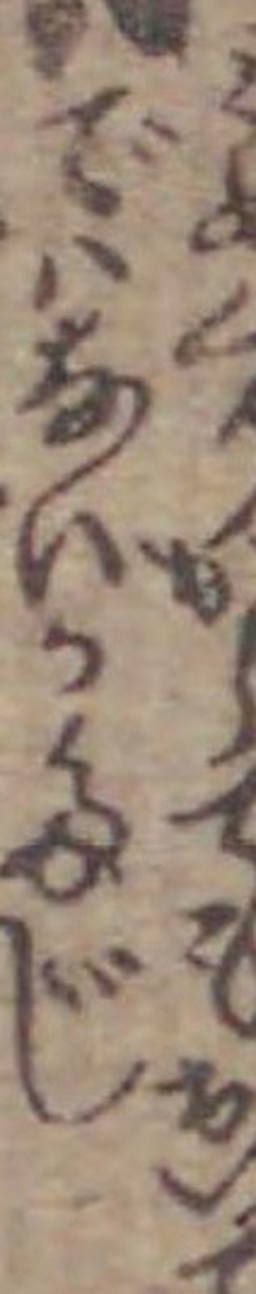ではないかたじ
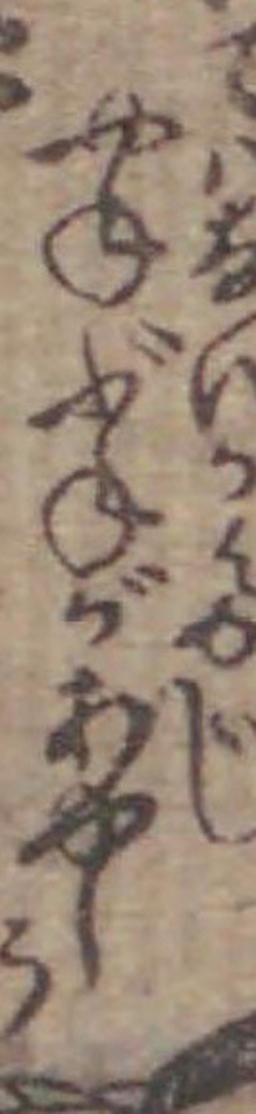やねぶねがあやしう

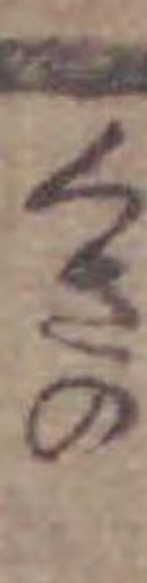くさの
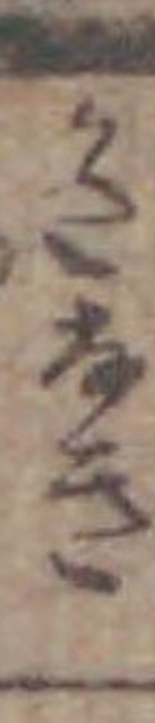かたなき
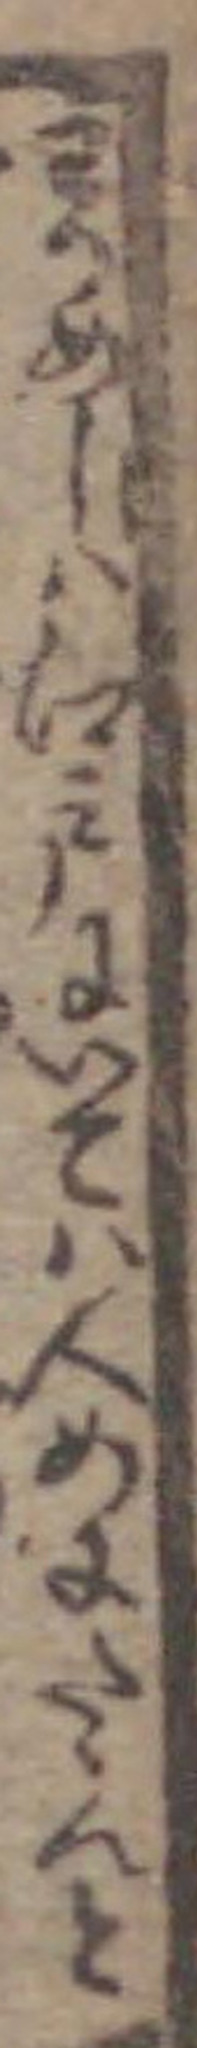わりめしは江戸にいては人めにたゝんと
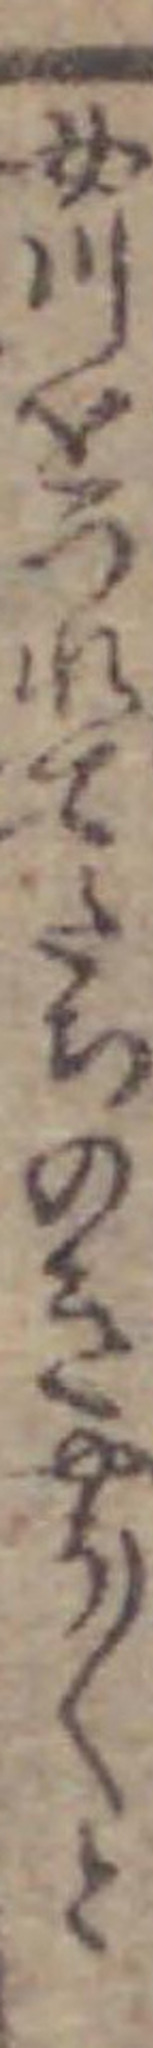女川をつれてたちのきやう〳〵と
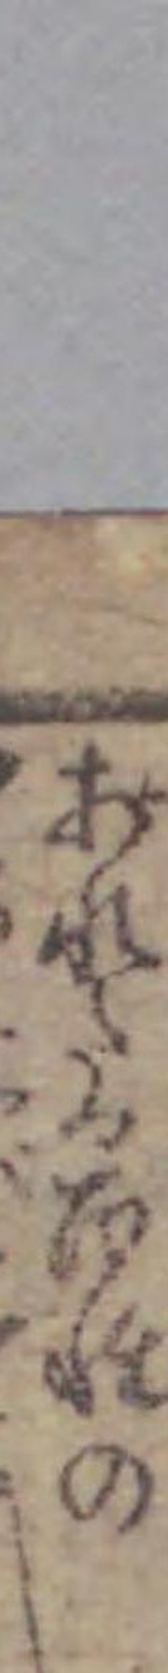あれたる百性の
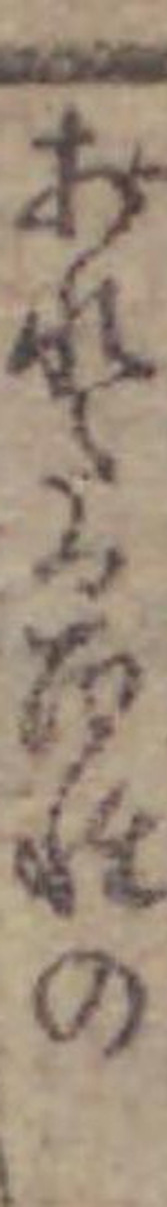あれたる百性の
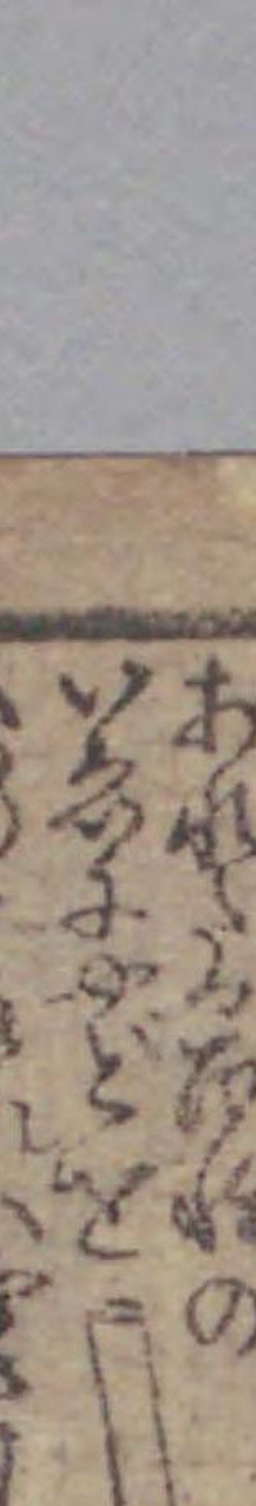いゑにやどを
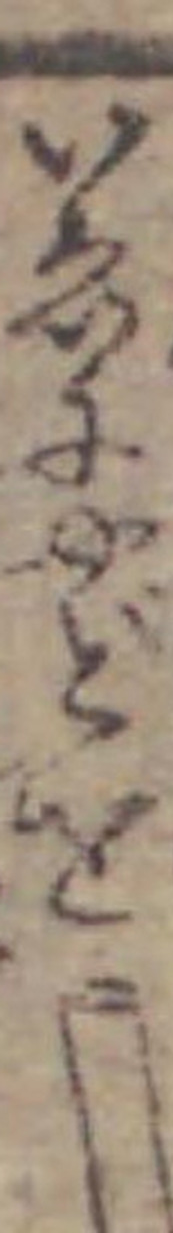いゑにやどを
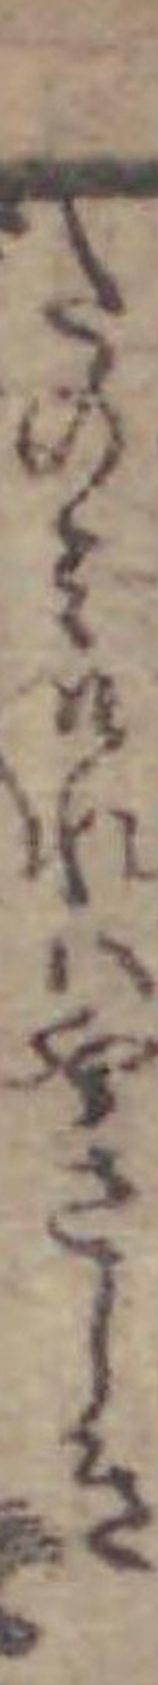たのみけれはやさしき
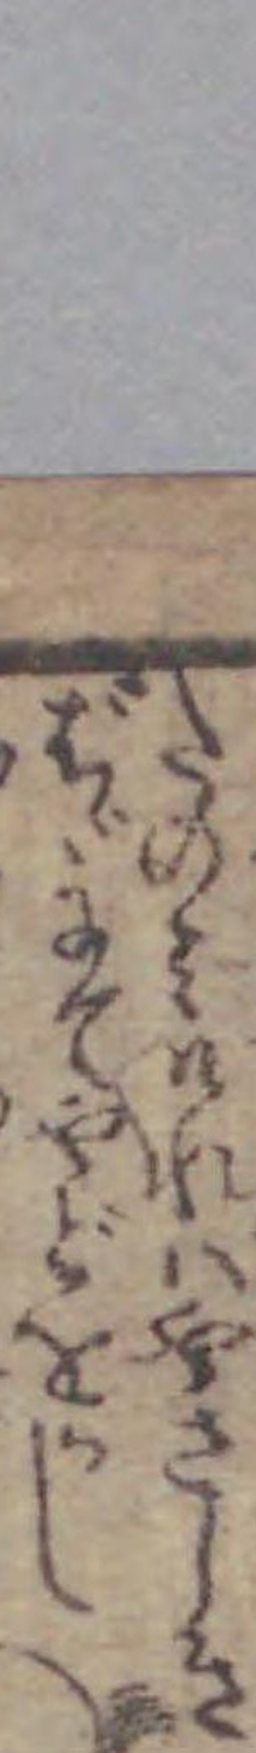ばゞにてやどをかし
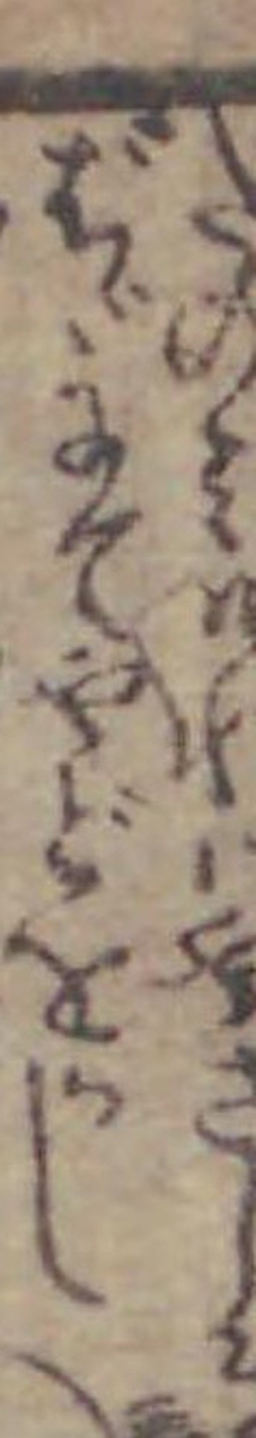ばゞにてやどをかし
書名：諸事米の飯 : 3巻
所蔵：国立国会図書館 National Diet Library, JAPAN
